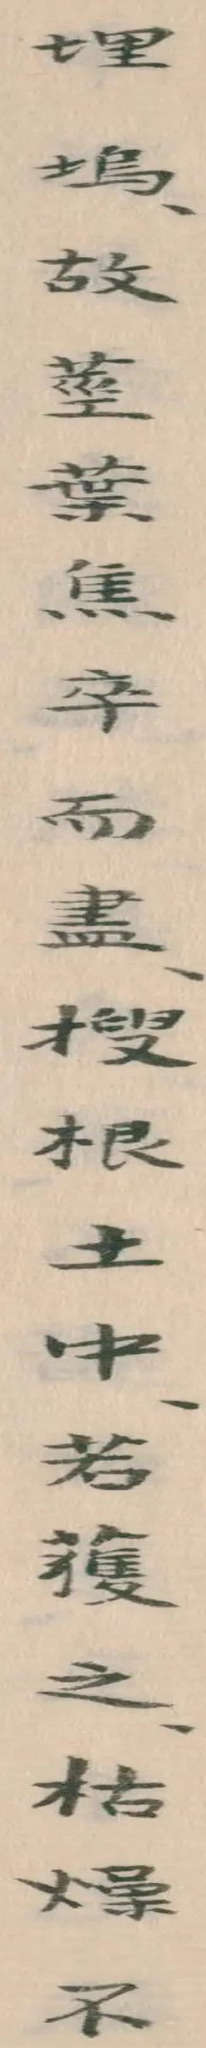埋塢、故茎葉焦卒而尽、楰根土中、若獲之、枯燥不
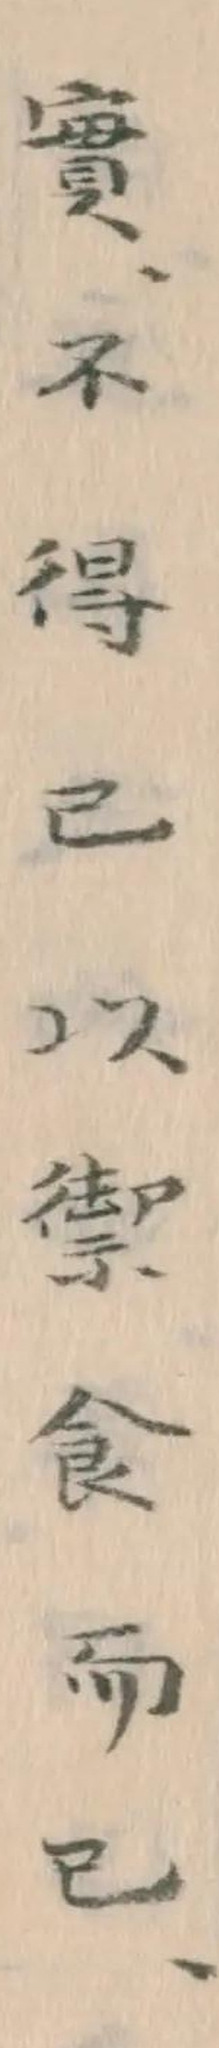実、不得已以禦食而已、
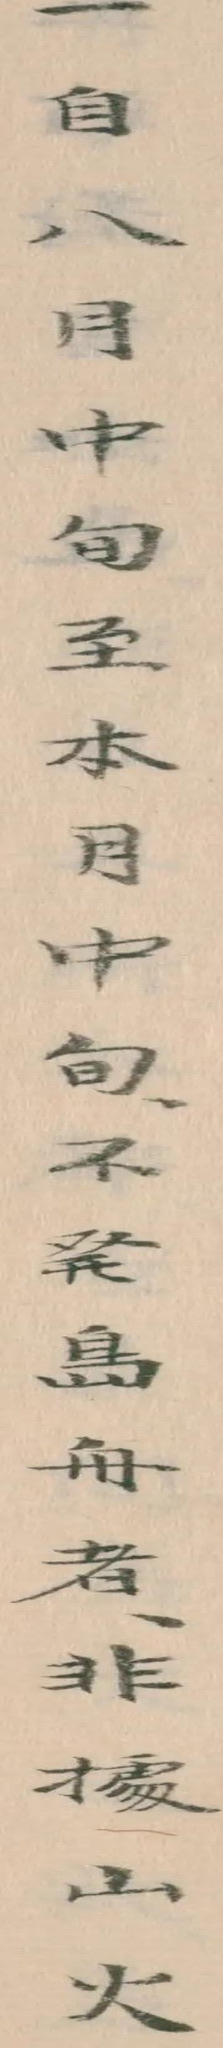一自八月中旬至本月中旬、不発島舟者、非拠山火
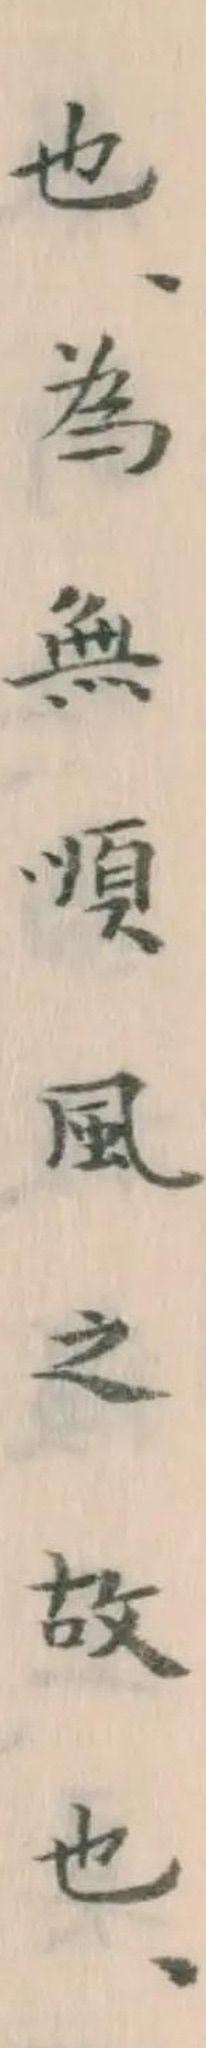也、為無順風之故也、
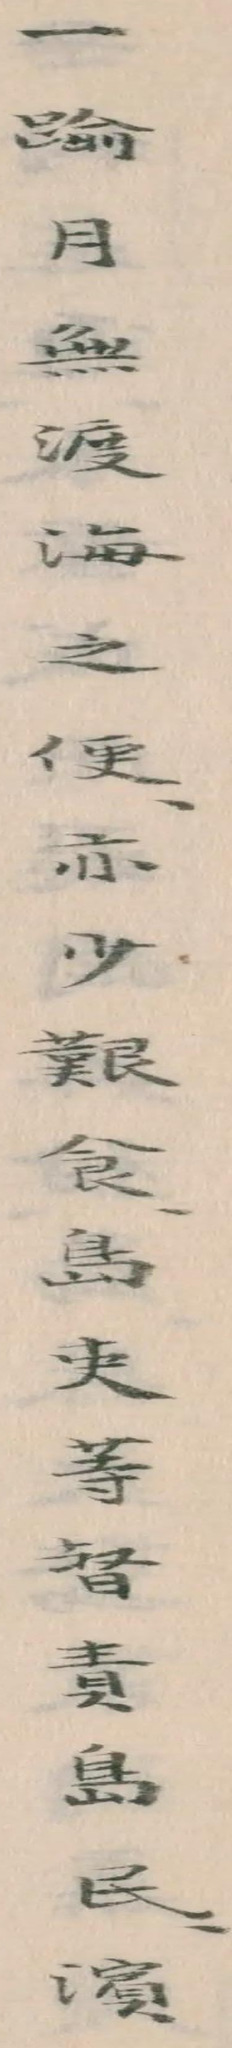一踰月無渡海之便、亦少艱食、島吏等督責島民、浜
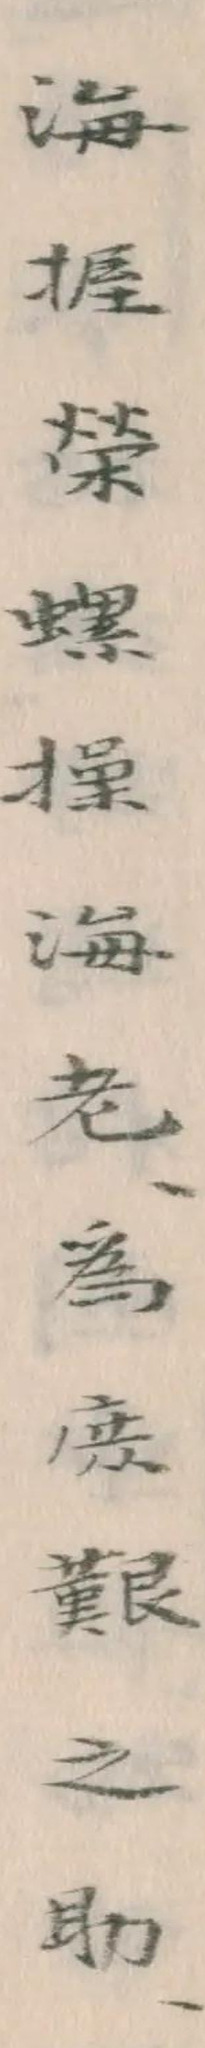海握栄螺操海老、為庶艱之助、
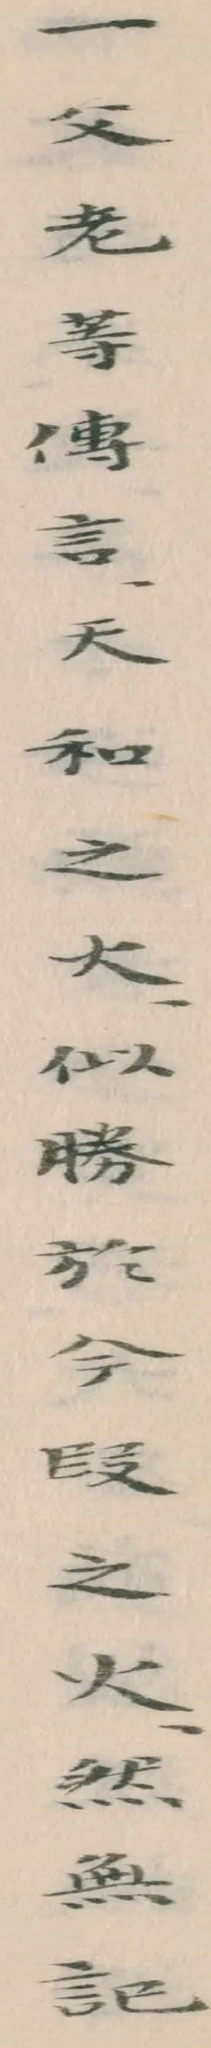一父老等伝言、天和之火、似勝於今段之火、然無記
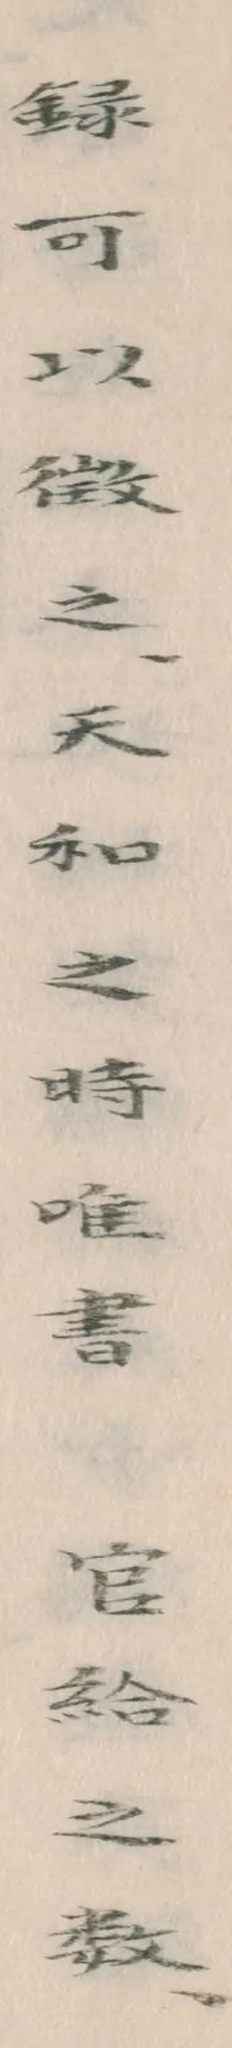録可以徴之、天和之時唯書官給之数、
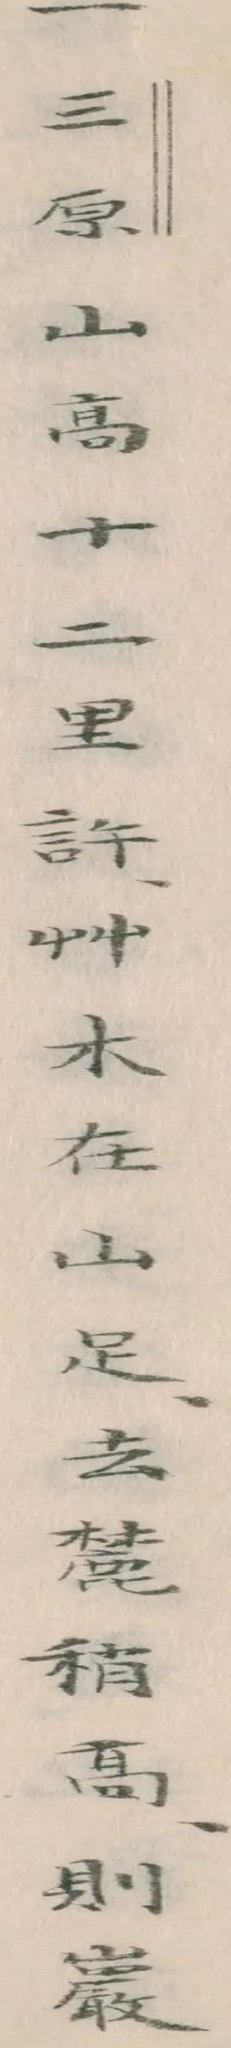一三原山高十二里許、艸木在山足、去麓稍高、則巌
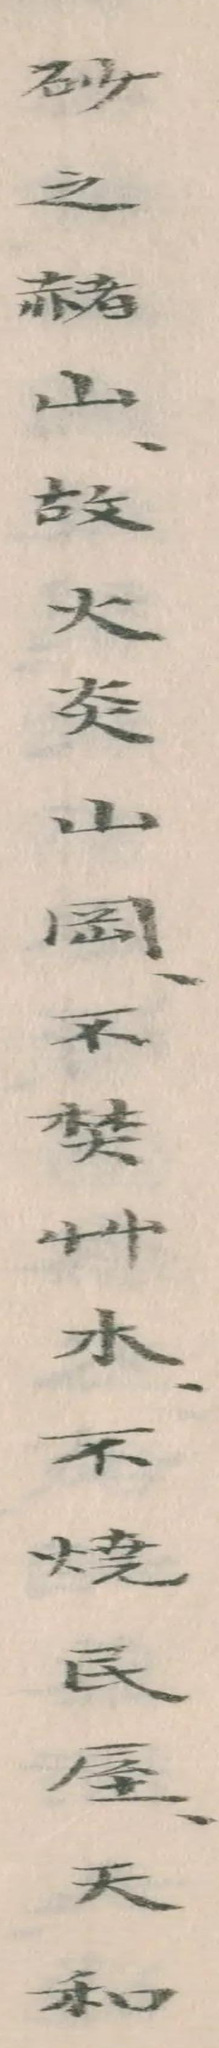砂之赭山、故火炎山岡、不焚艸木、不焼民屋、天和
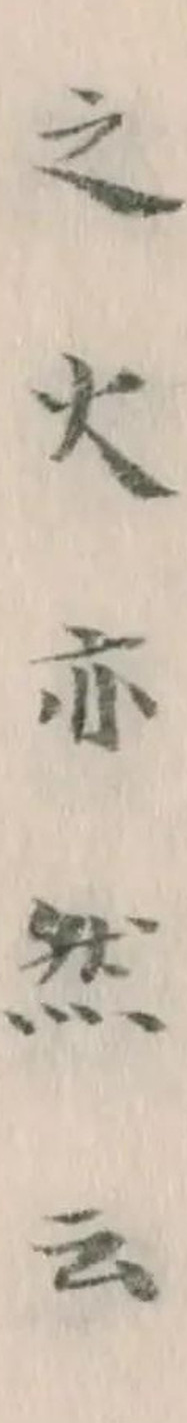之火亦然云
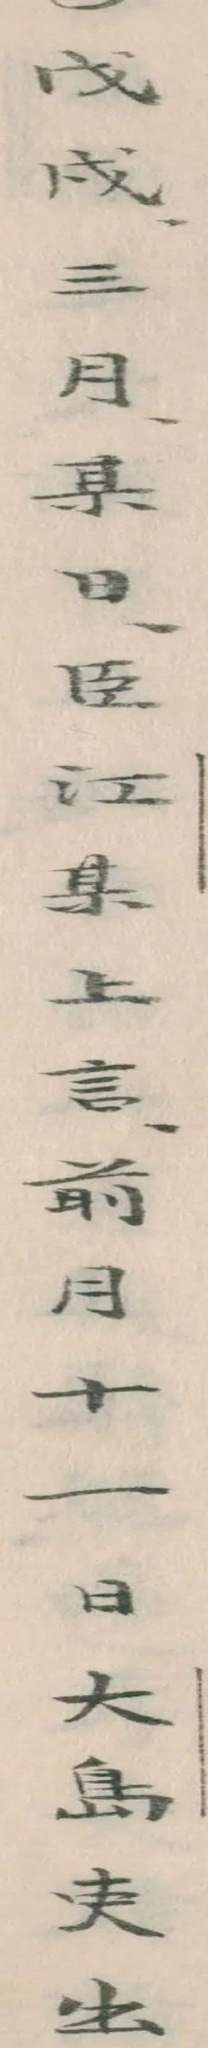○戊戌、三月、某日、臣江某上言、前月十一日大島吏出
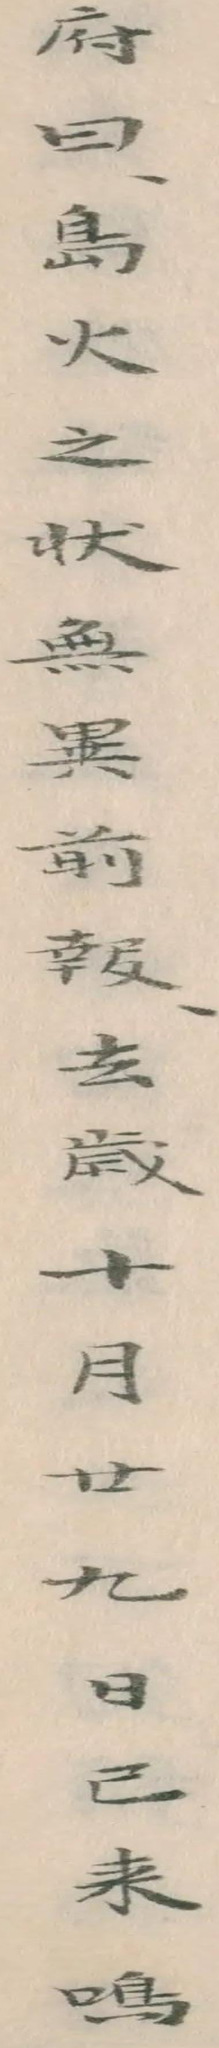府曰、島火之状無異前報、去歳十月廿九日已来鳴

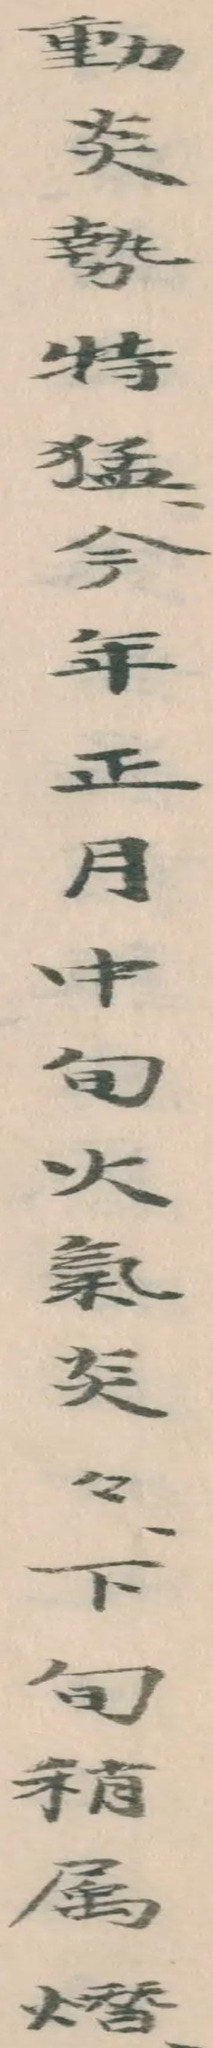動炎勢特猛、今年正月中旬火気炎々、下旬稍属熸、
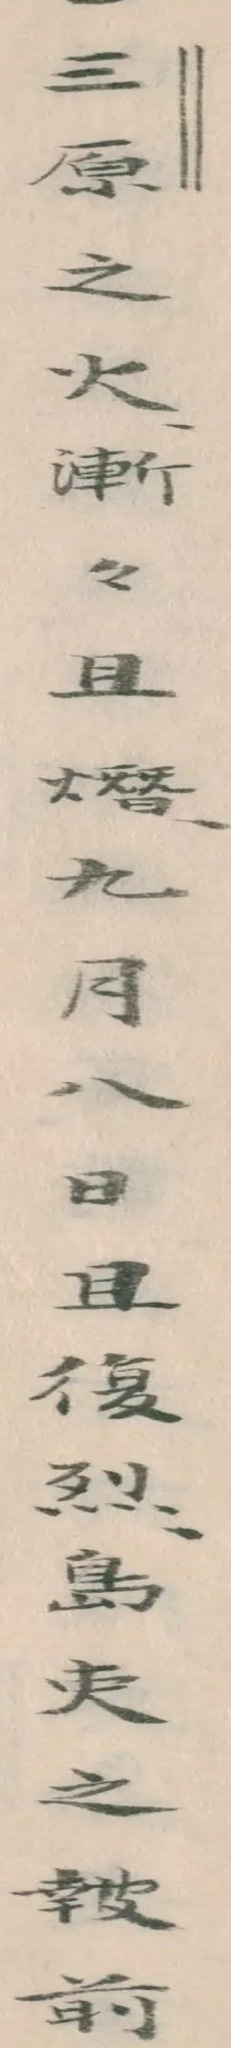○三原之火、漸々且熸、九月八日且復烈、島吏之報前
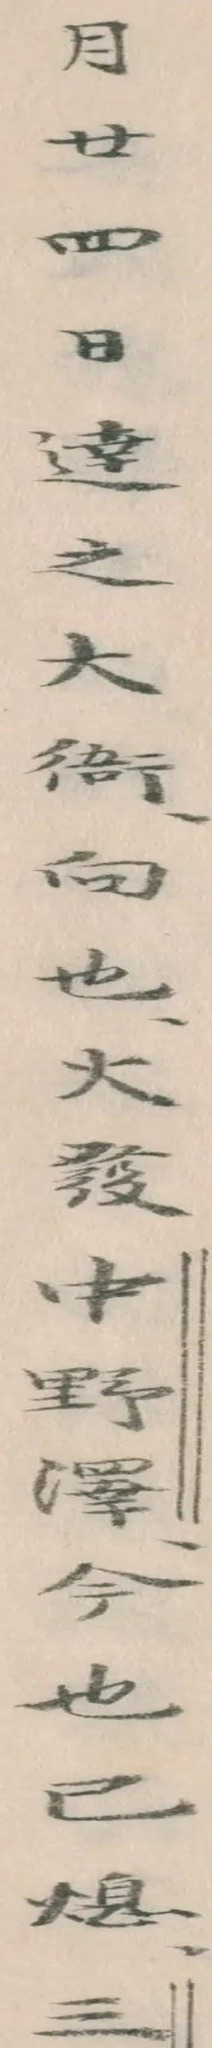月廿四日達之大衙、向也、火発中野沢、今也已熄、三
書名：地災撮要. 巻11-12(地震之部)
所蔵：国立国会図書館 National Diet Library, JAPAN
